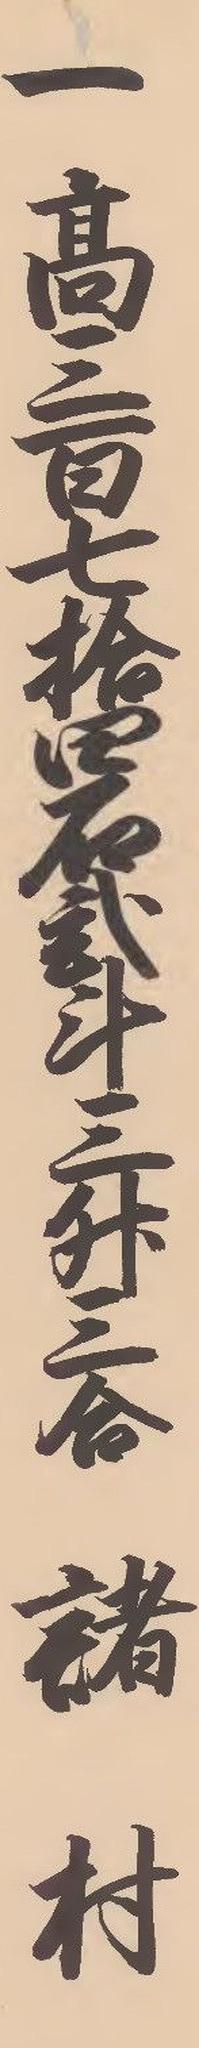一高三百七拾四石弐斗三升三合諸村
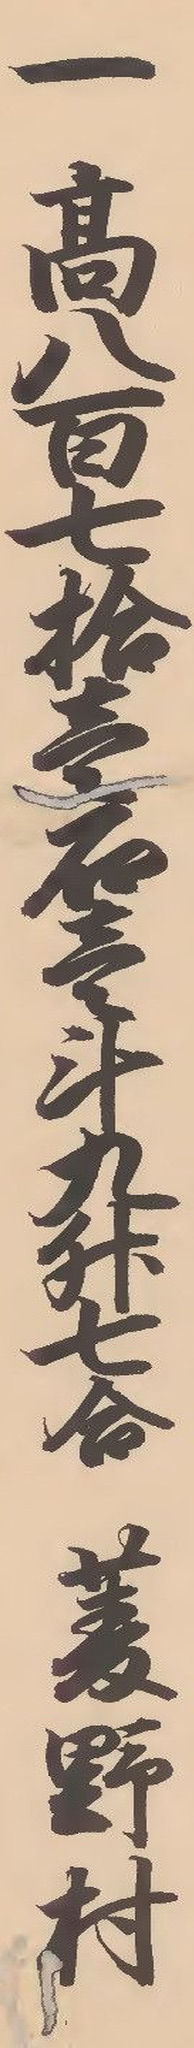一高八百七拾壱石壱斗九升七合菱野村

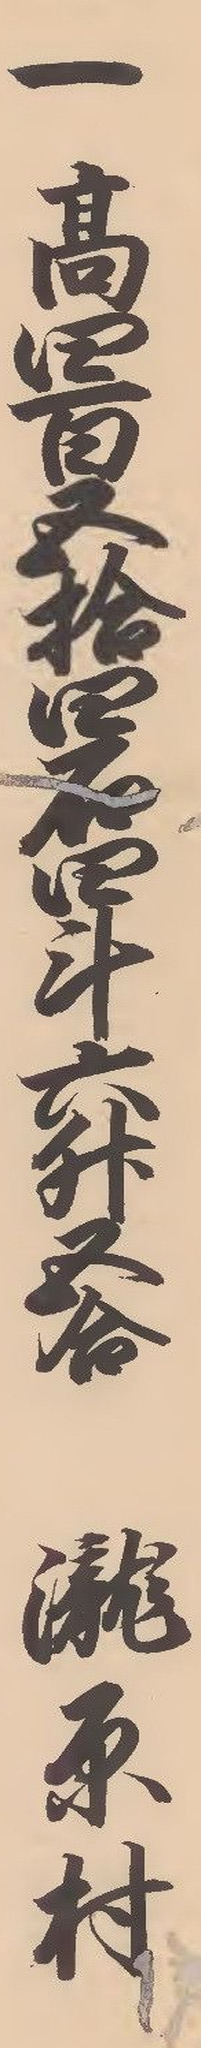一高四百五拾四石四斗六升五合滝原村
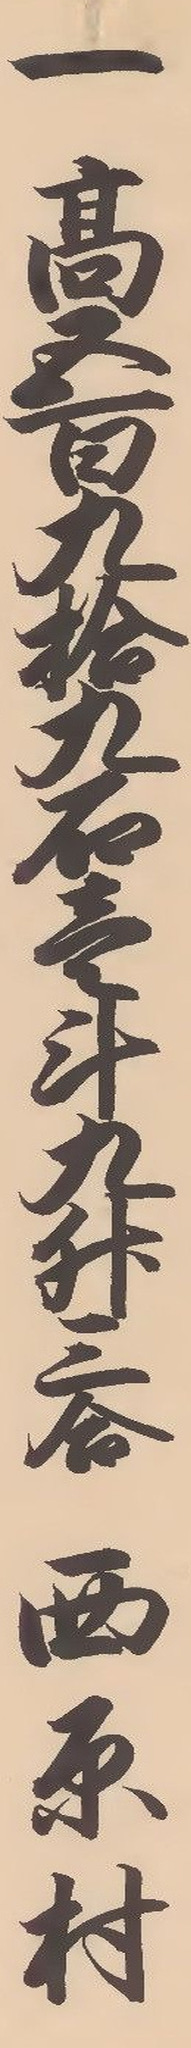一高五百九拾九石壱斗九升三合西原村
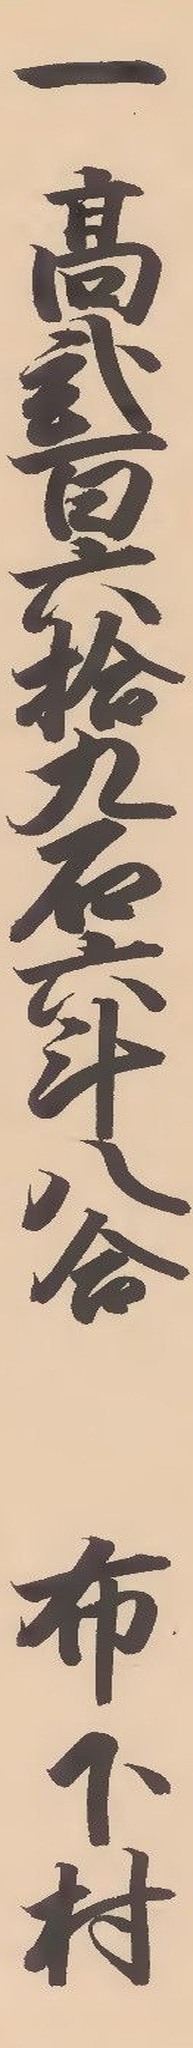一高弐百六拾九石六斗八合布下村
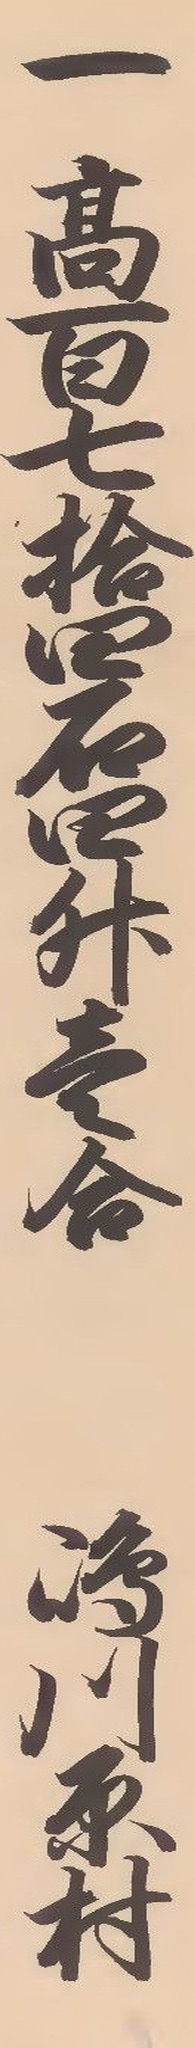一高百七拾四石四升壱合島川原村
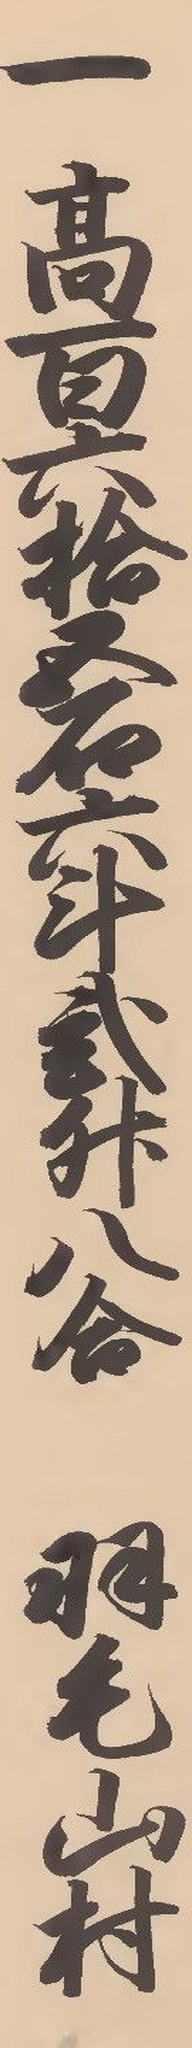一高百六拾五石六斗弐升八合羽毛山村
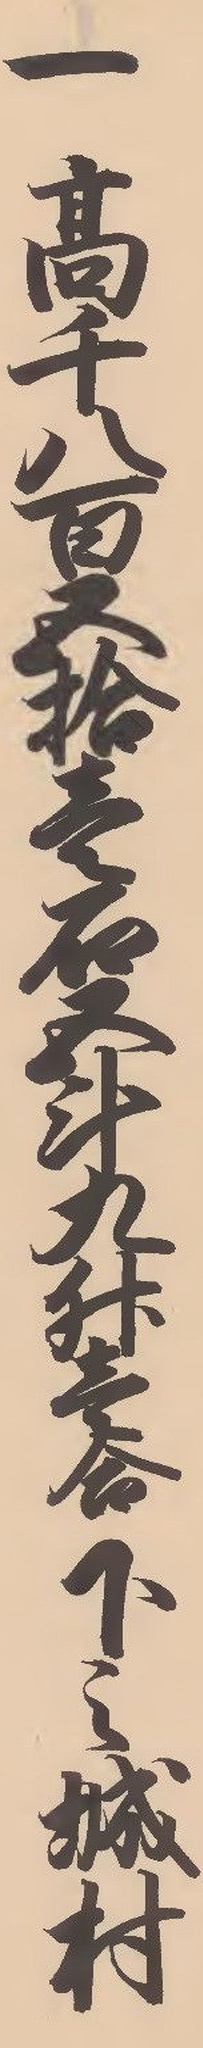一高千八百五拾壱石五斗九升壱合下之城村
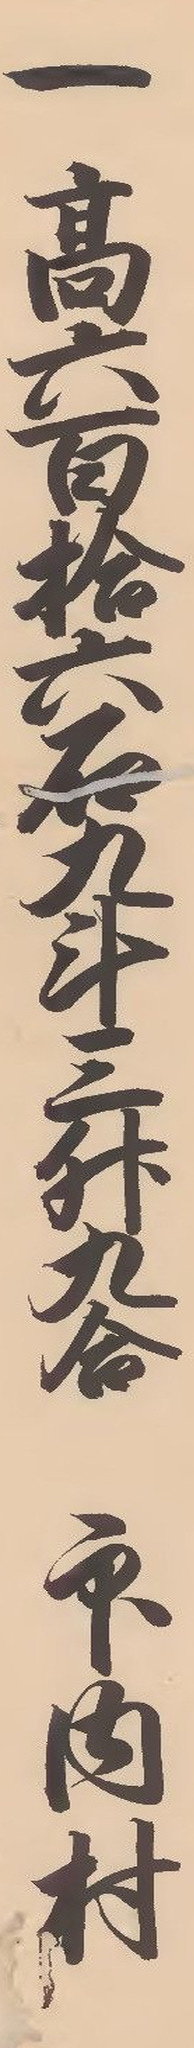一高六百拾六石九斗三升九合印内村

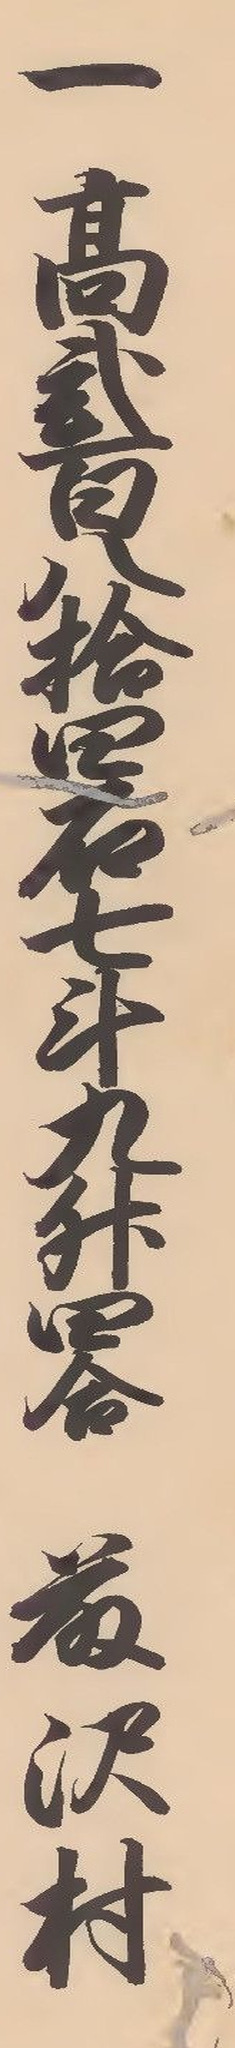一高弐百八拾四石七斗九升四合藤沢村
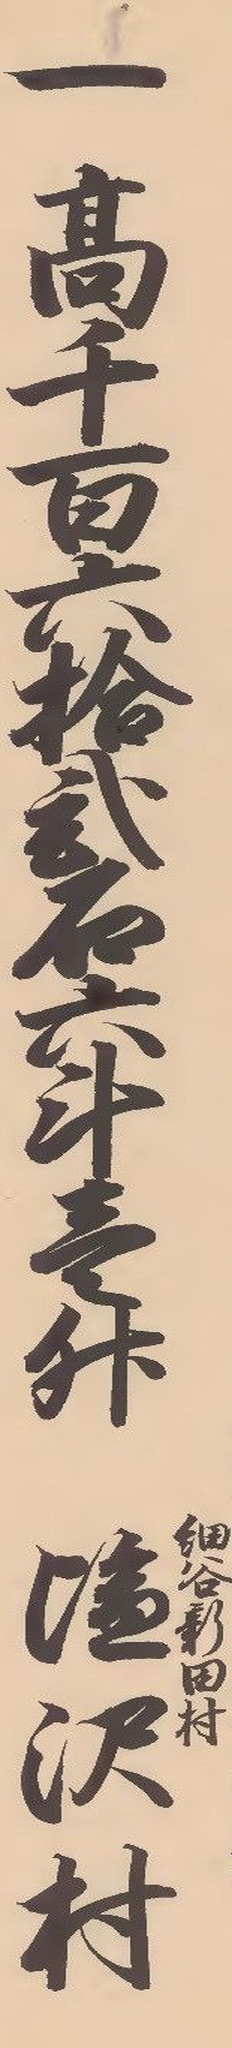一高千百六拾弐石六斗壱升塩沢村
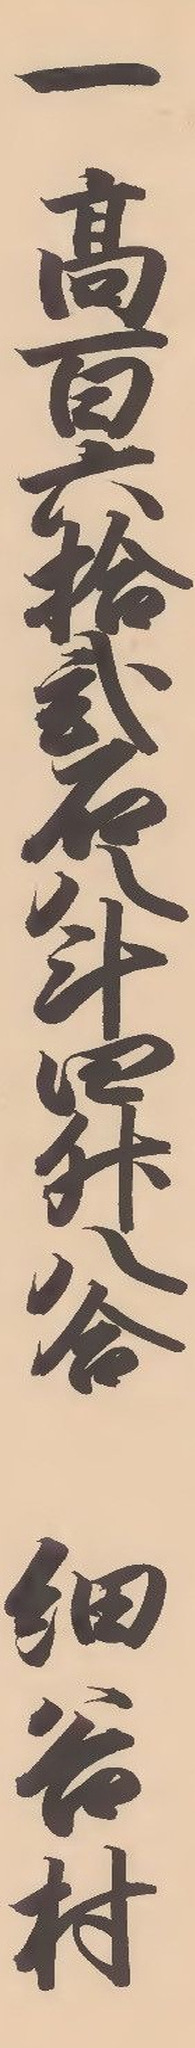一高百六拾弐石八斗四升八合細谷村
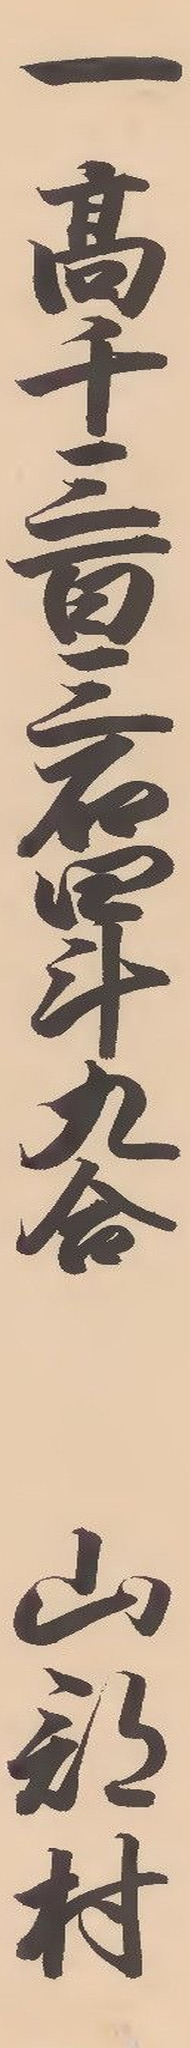一高千三百三石四斗九合山部村
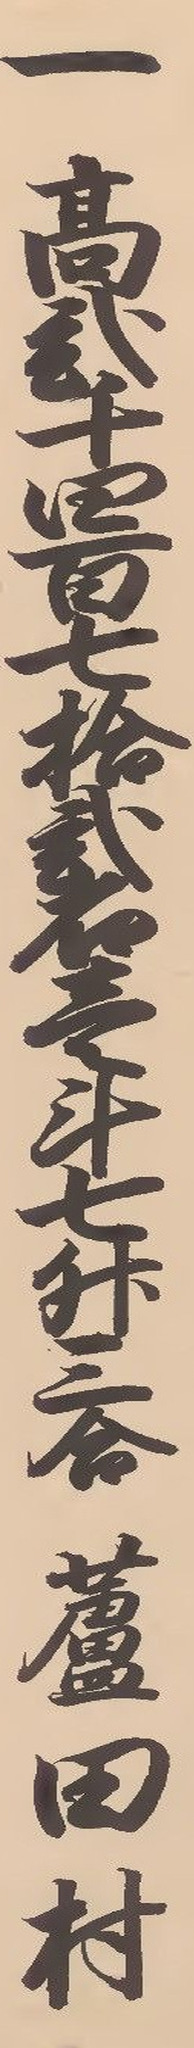一高弐千四百七拾弐石壱斗七升三合芦田村
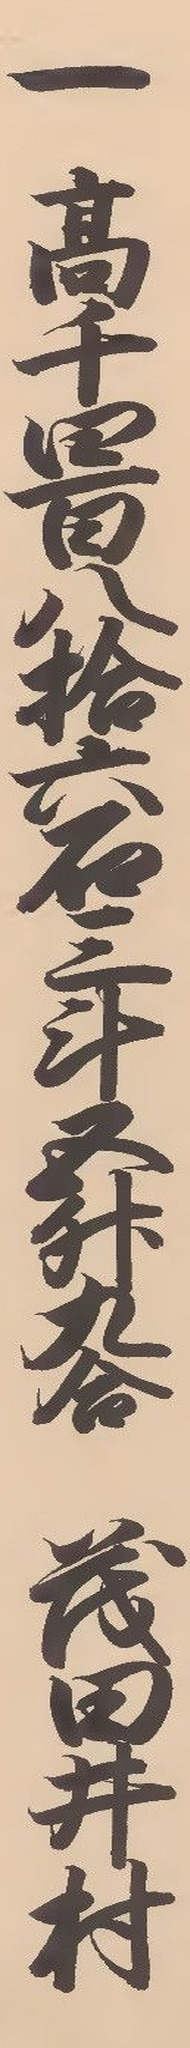一高千四百八拾六石三斗五升九合茂田井村
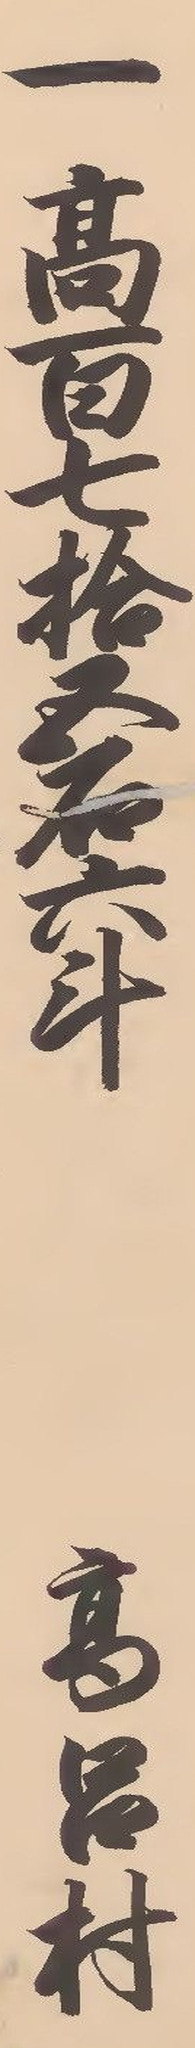一高百七拾五石六斗高呂村
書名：信濃国郷帳
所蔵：国立公文書館 National Archives of Japan
